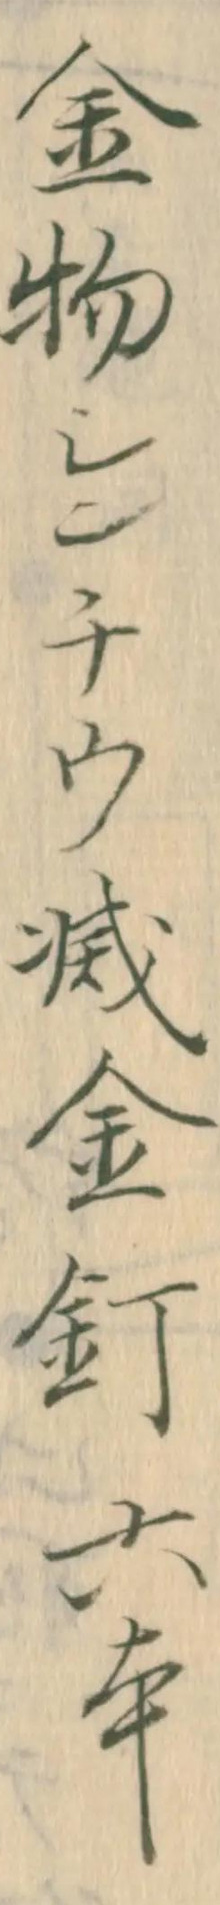金物シンチウ滅金釘六本
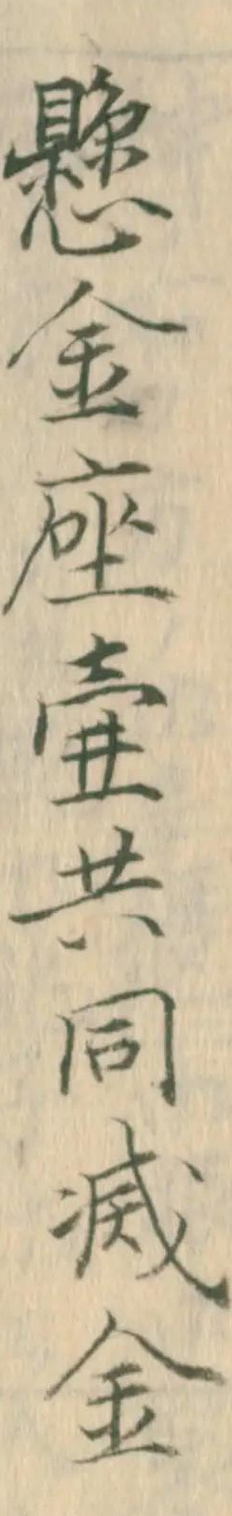懸金座壺共同滅金

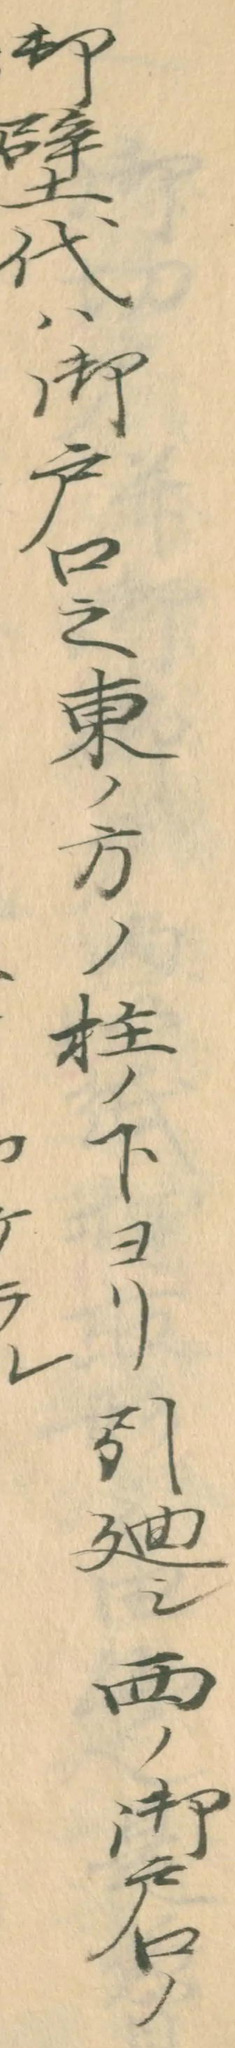御壁代ハ御戸口之東ノ方ノ柱ノ下ヨリ引廻シ西ノ御戸口ノ
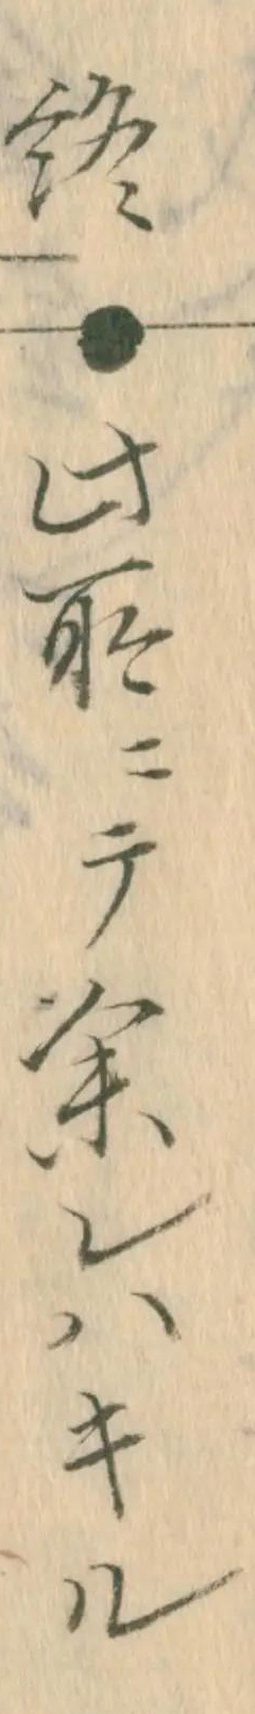終此所ニテ余レハキル
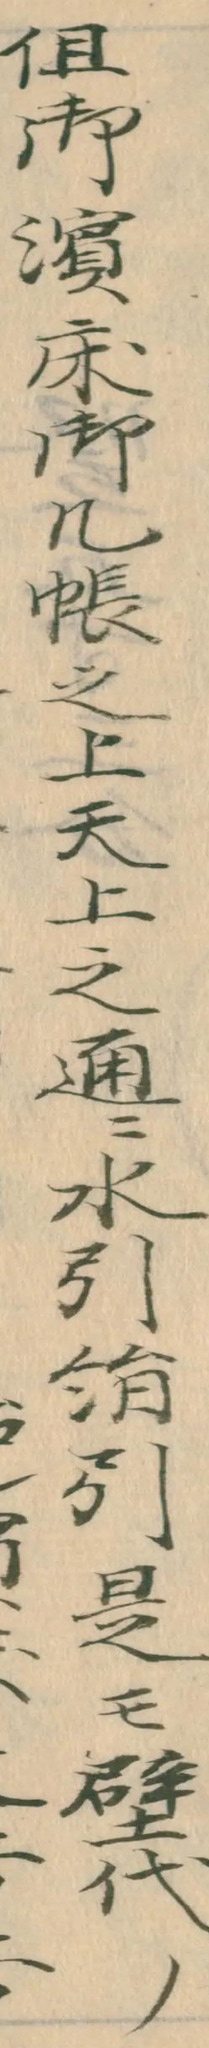但御浜床御几帳之上天上之通ニ水引絹引是モ壁代ノ
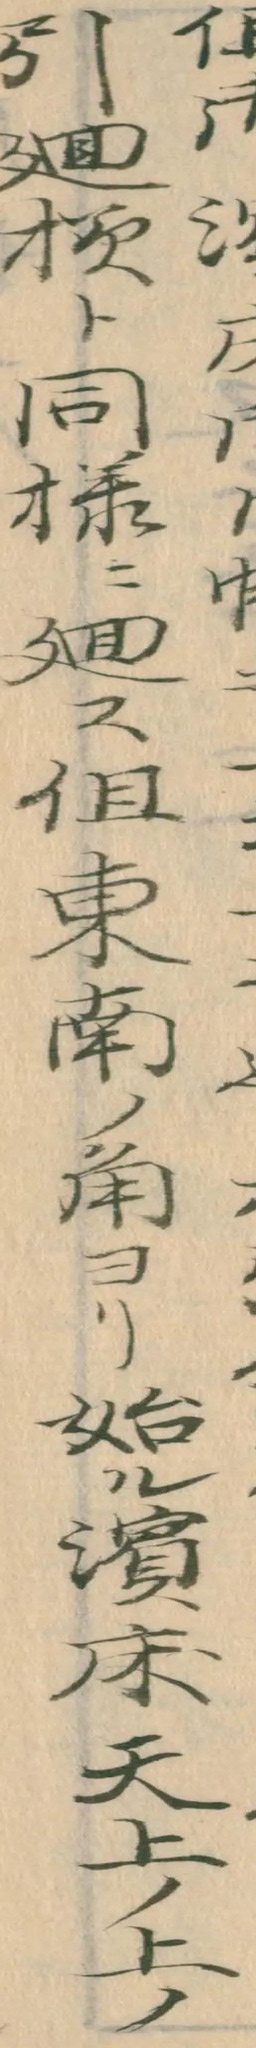引廻様ト同様ニ廻ス但東南ノ角ヨリ始ル浜床天上ノ上ノ
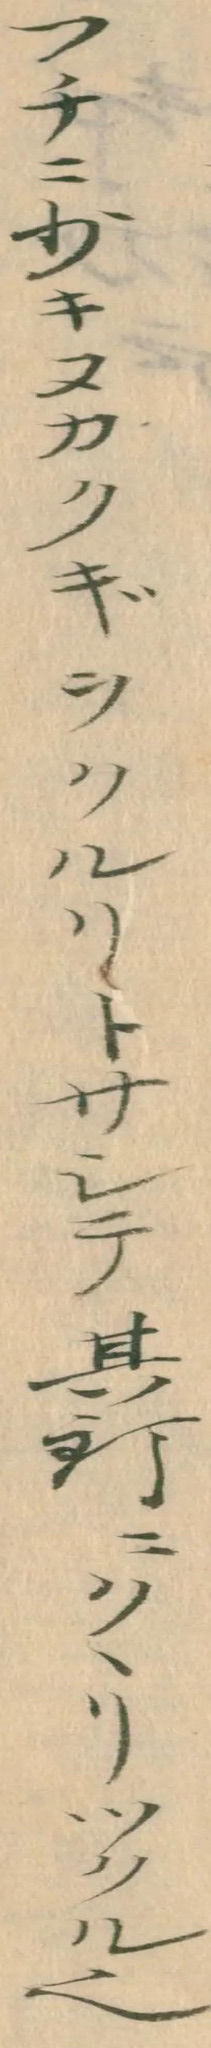フチニ少キヌカクギヲクルリトサシテ其釘ニクヽリツクル也
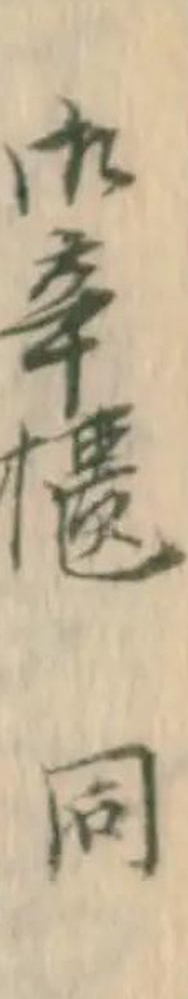御辛櫃同
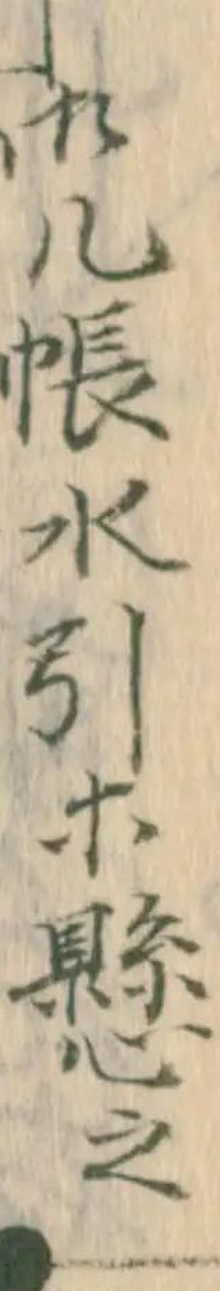御几帳水引等懸之
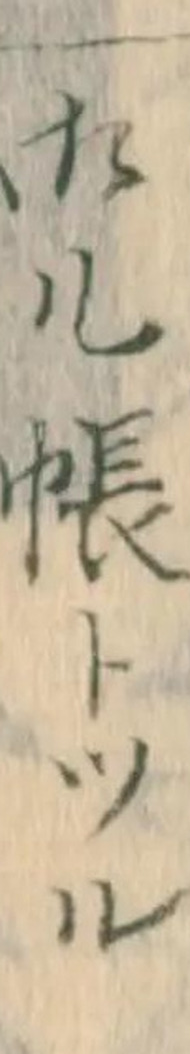御几帳トツル
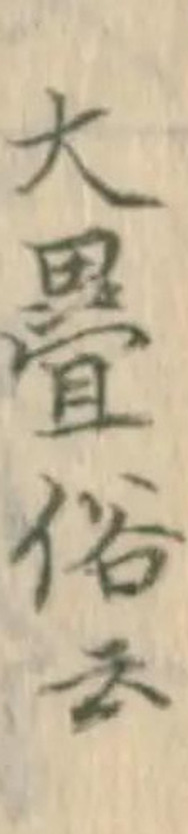大畳俗云
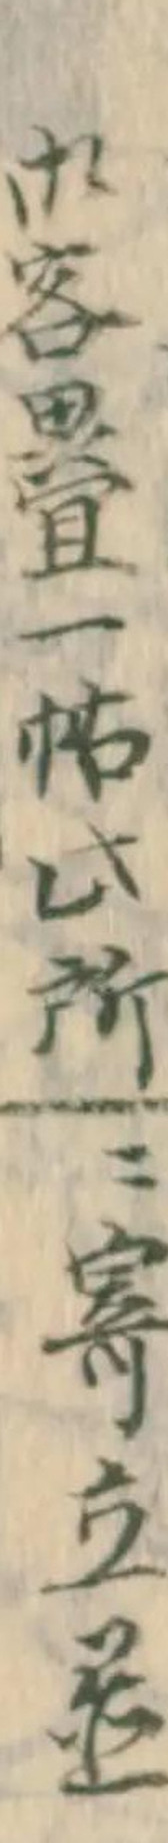御客畳一帖此所ニ寄立置
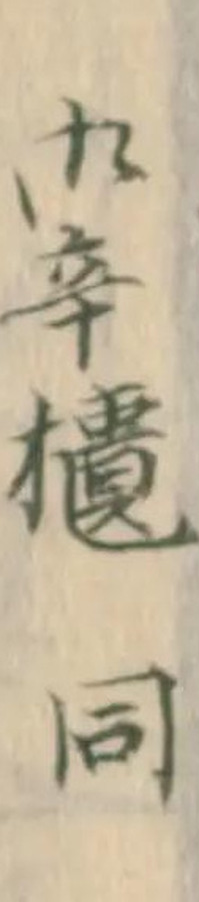御辛櫃同
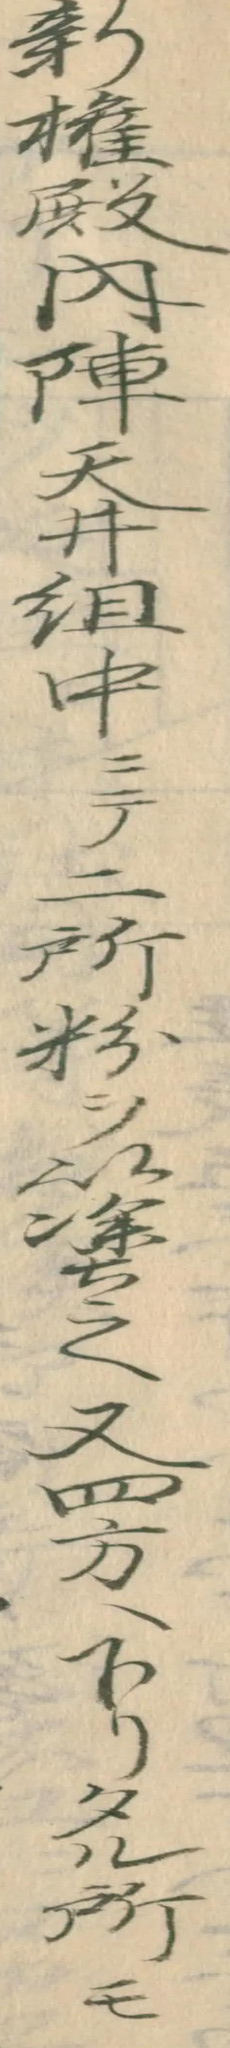新権殿内陣天井組中ニテ二所粉ヲ以塗之又四方ヘ下リタル所モ

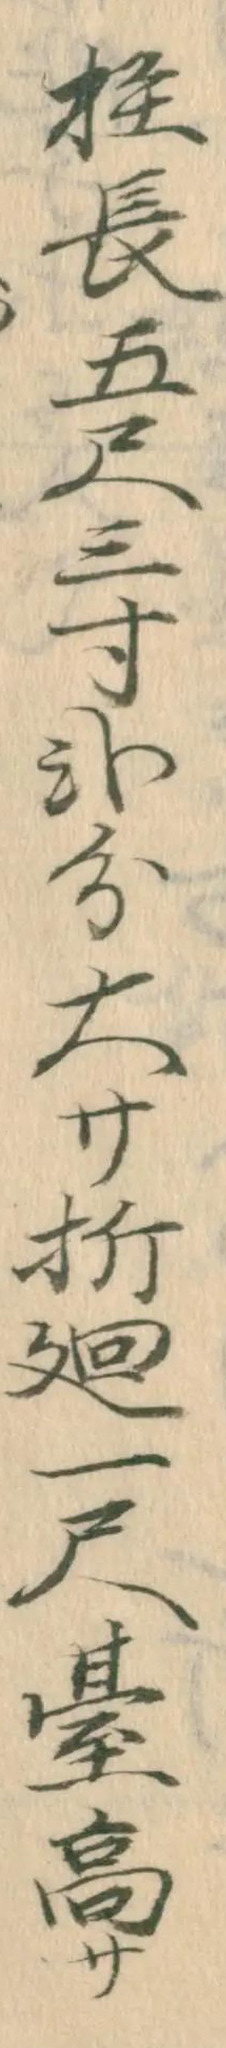柱長五尺三寸弐分大サ折廻一尺台高サ
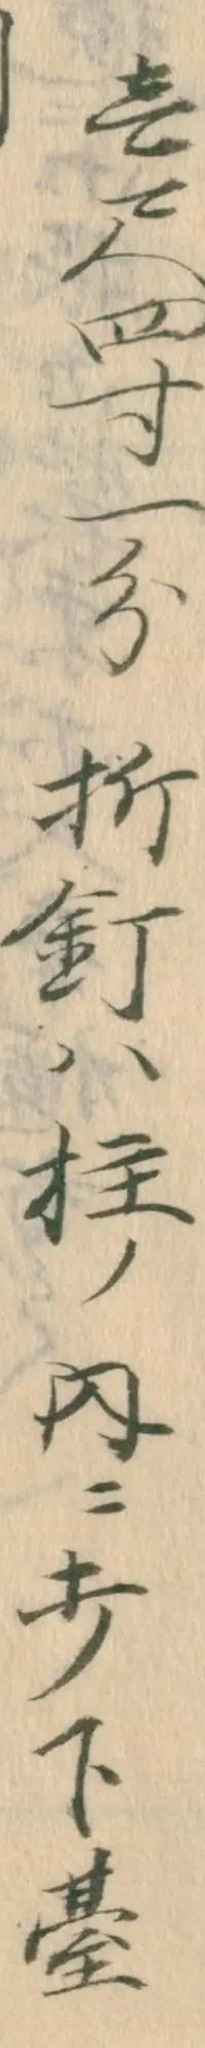左ニ同壱尺四寸一分折釘ハ柱ノ内ニ打下台
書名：賀茂社記録. 第15冊
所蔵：国立国会図書館 National Diet Library, JAPAN
